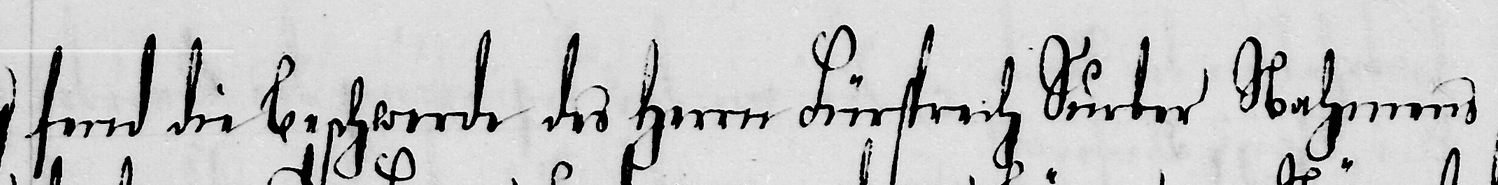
fend die Beschwerde des Herrn Fürsprech Surber Nahmens
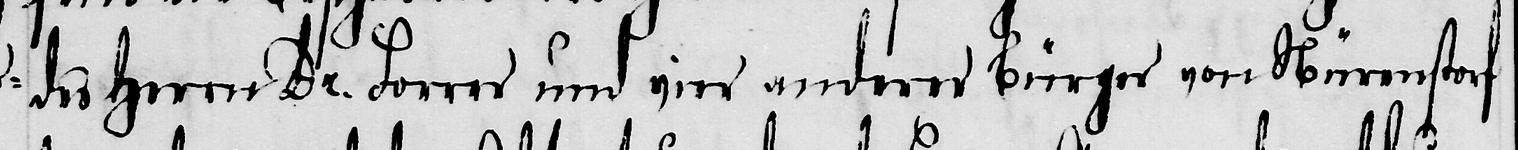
des Herrn Dr. Forrer und vier anderer Bürger von Nürenstorf
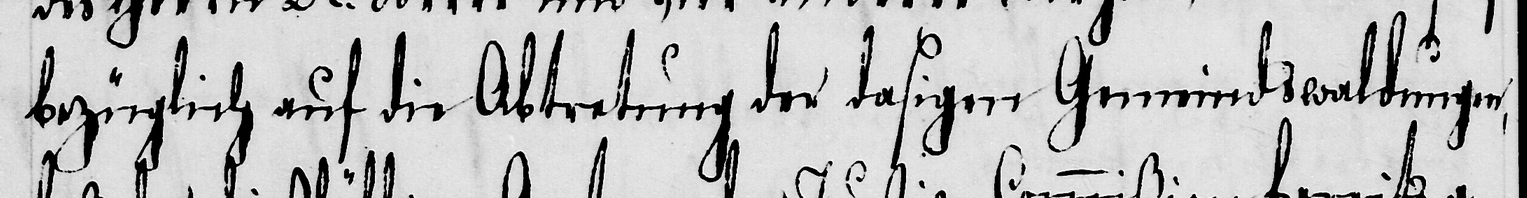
bezüglich auf die Abtretung der dasigen Gemeindswaldung¬
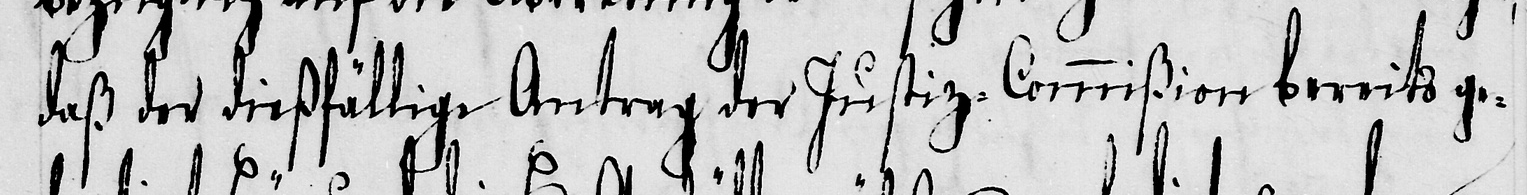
daß der dießfällige Antrag der Justiz-Commißion bereits ge¬
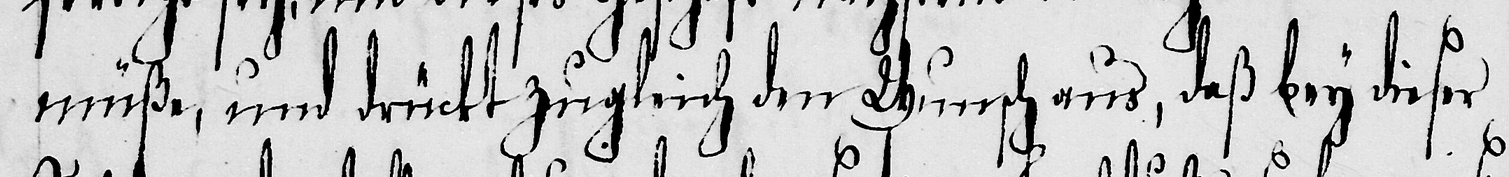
müße, und drückt zugleich den Wunsch aus, daß bey dieser
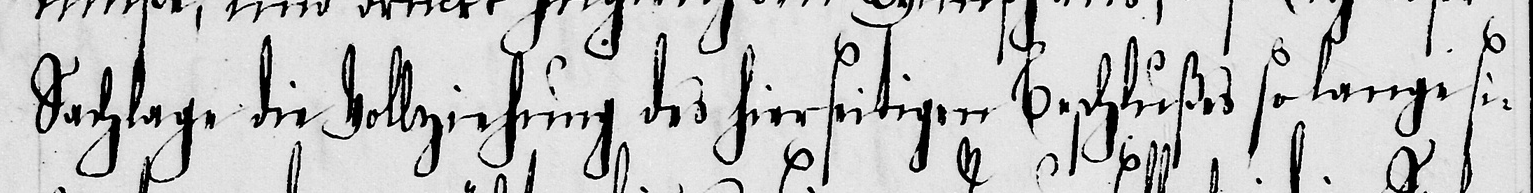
Sachlage die Vollziehung des hierseitigen Beschlußes so lange
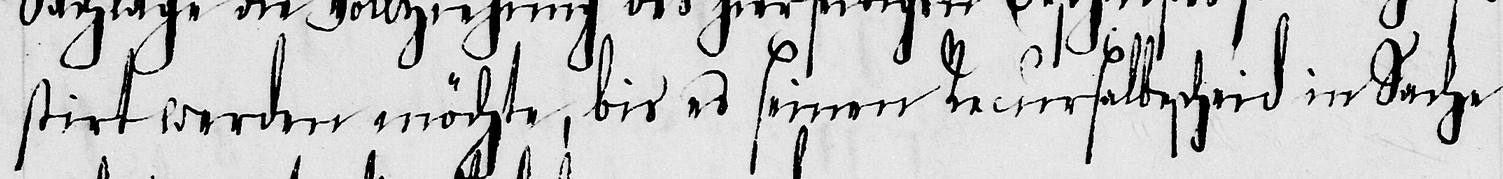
stirt werden möchte, bis es seinen Recursalbescheid in Sache
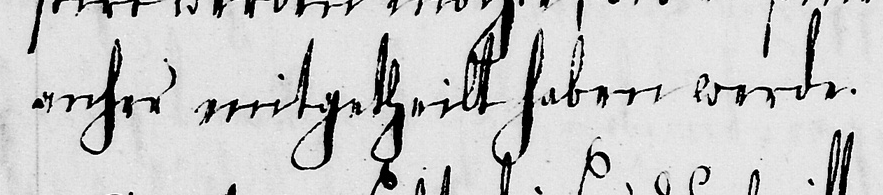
anher mitgetheilt haben werde.
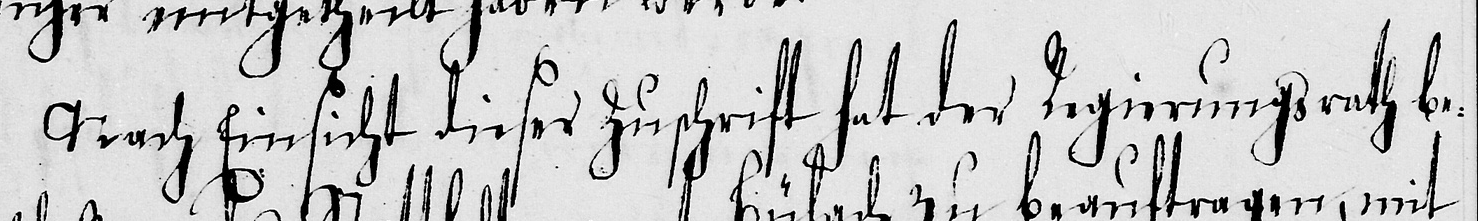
Nach Einsicht dieser Zuschrift hat der Regierungsrath b¬
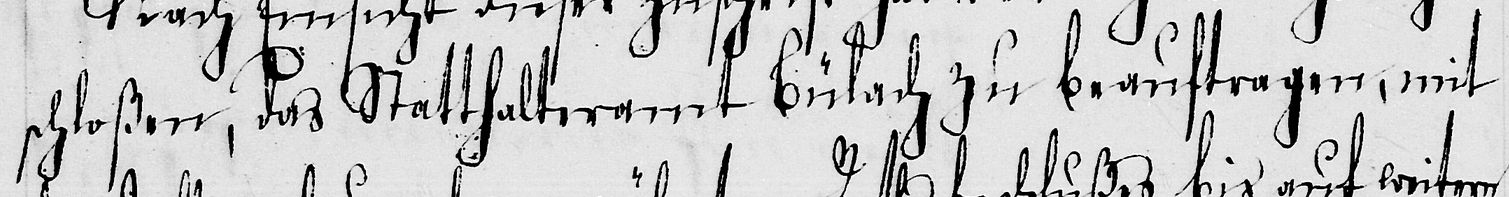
schloßen, das Statthalteramt Bülach zu beauftragen, mit
